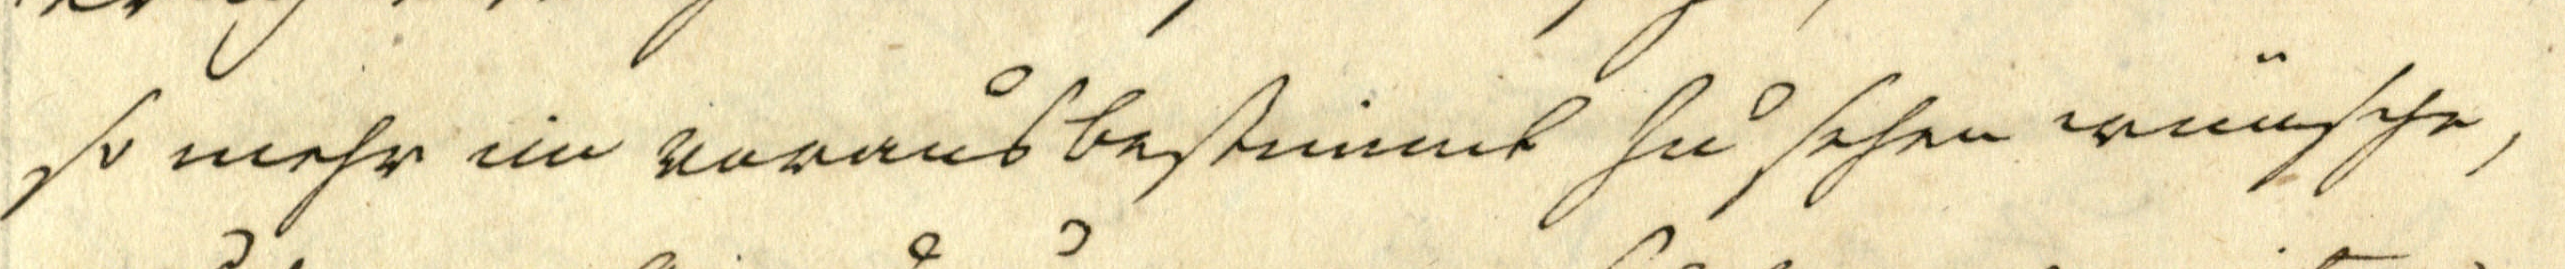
so mehr im voraus bestimmt zu sehen wünsche,
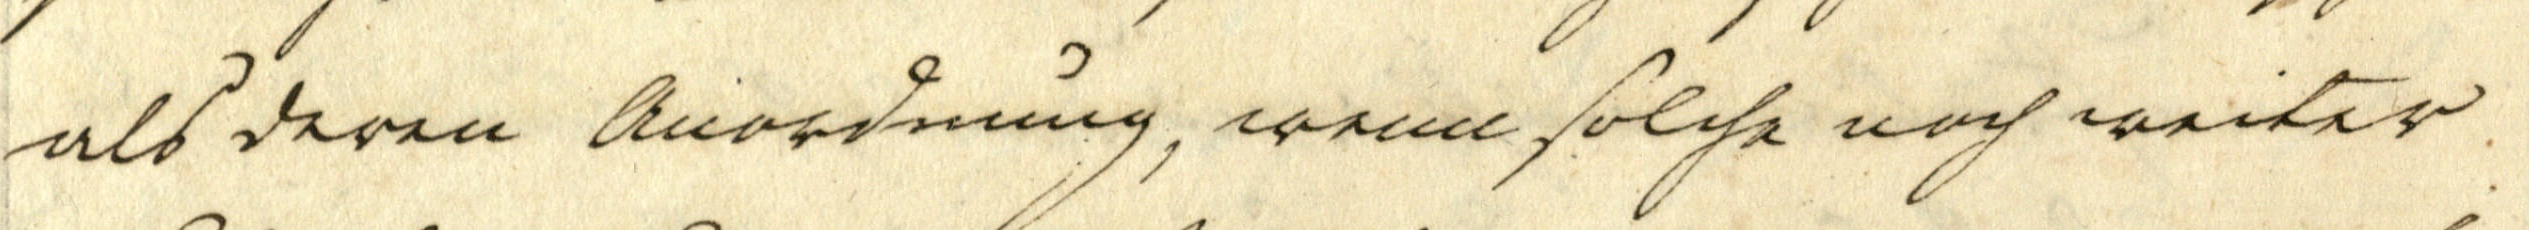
als deren Anordnung, wenn solche noch weiter
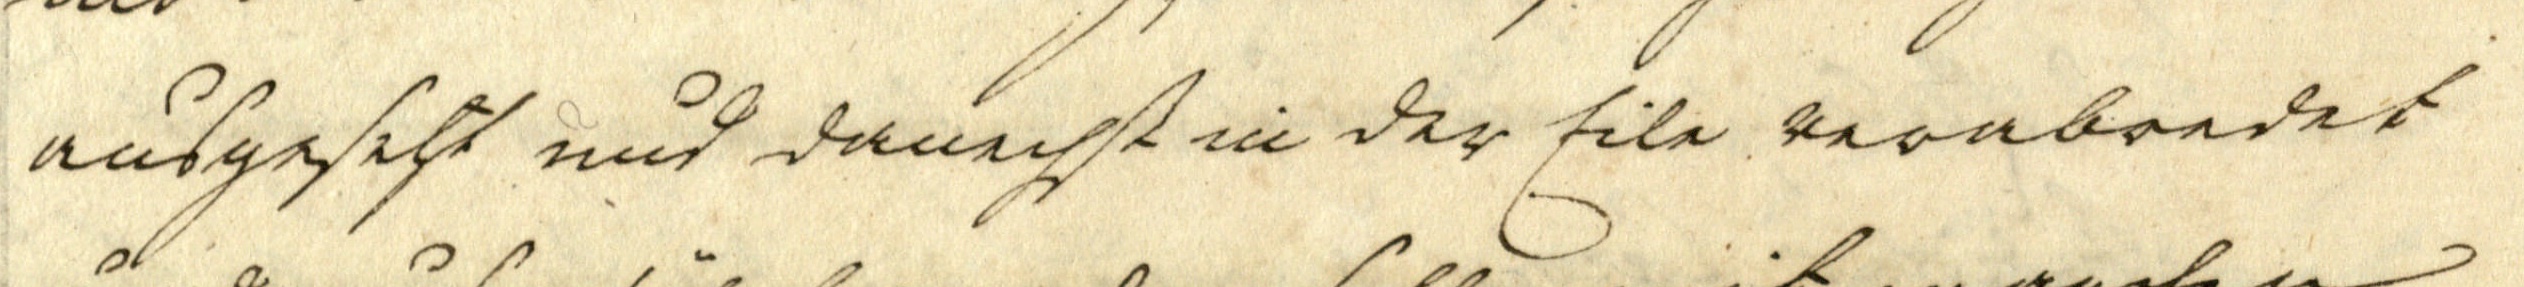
ausgesetzt und danechst in der Eile verabredet
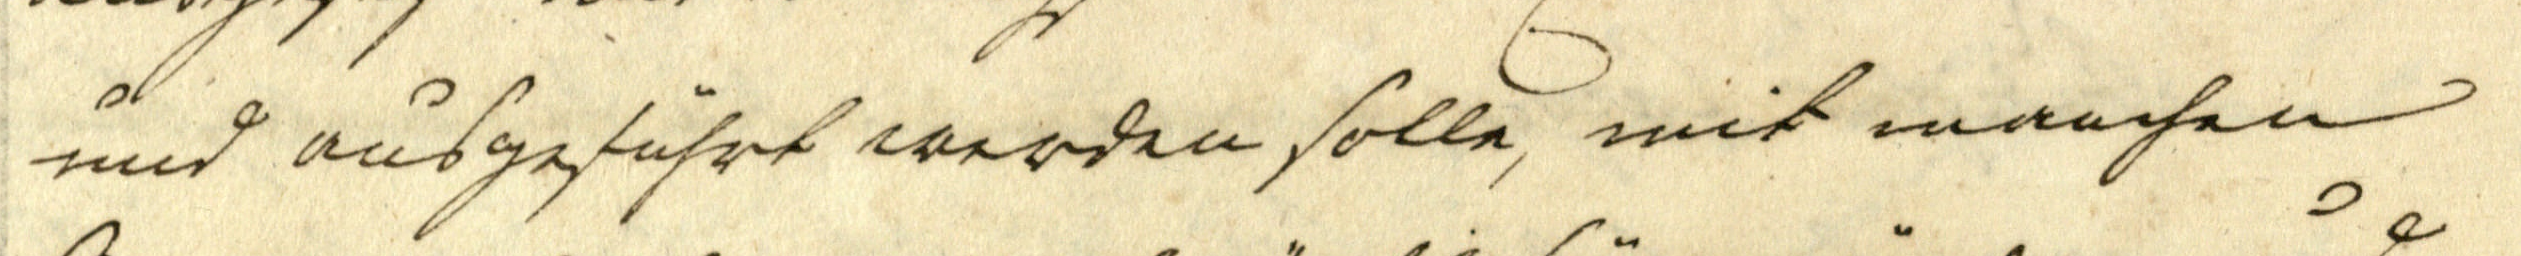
und ausgeführt werden solle, mit manchen
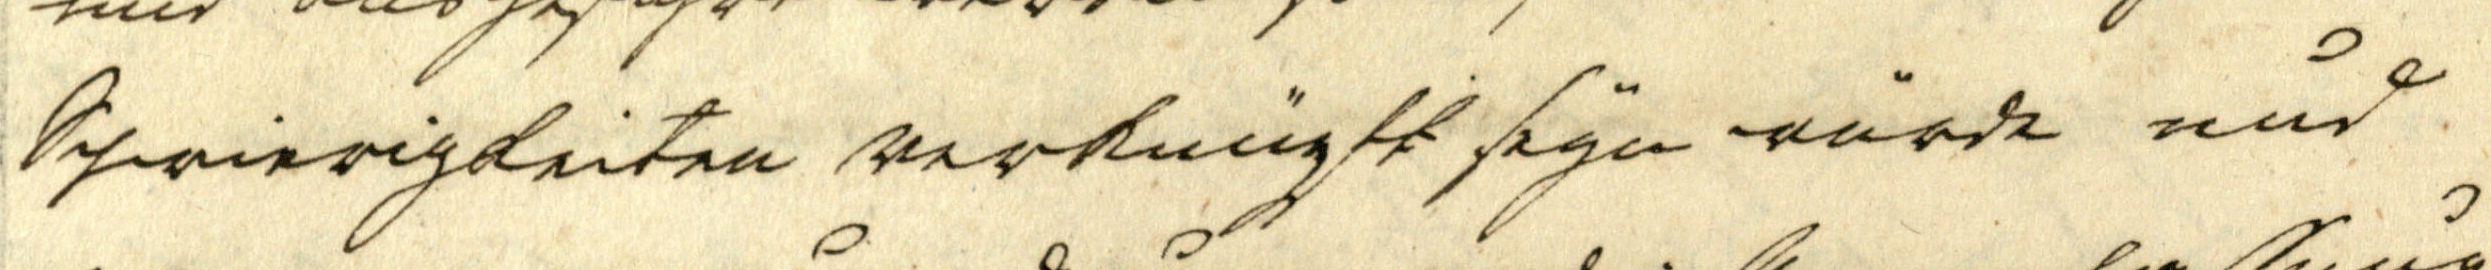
Schwierigkeiten verknüpft seÿn würde und
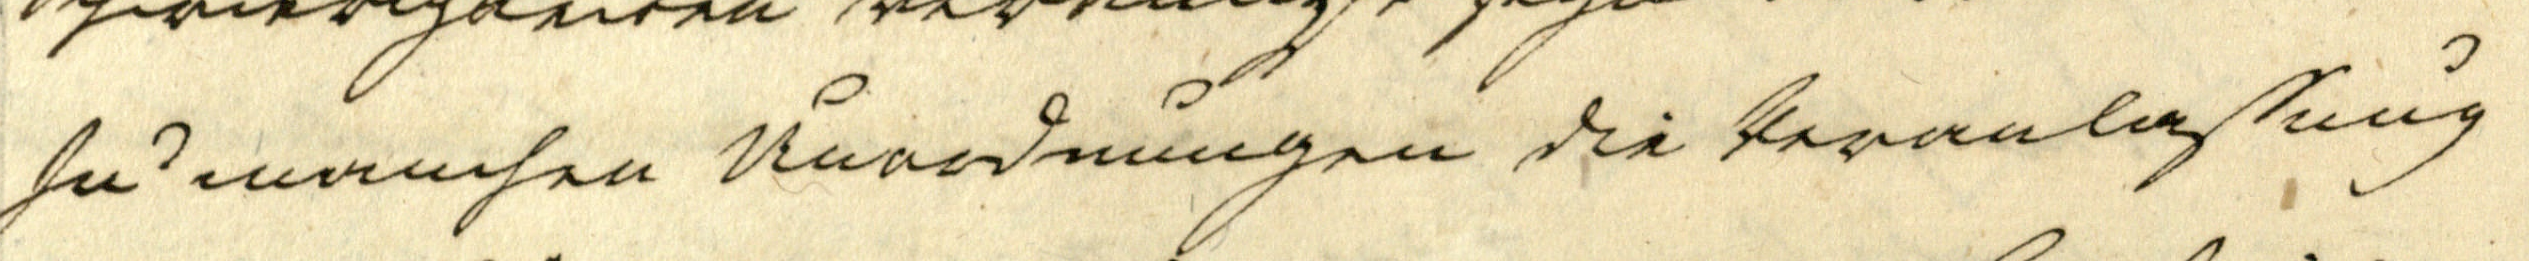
zu manchen Unordnungen die Veranlassung
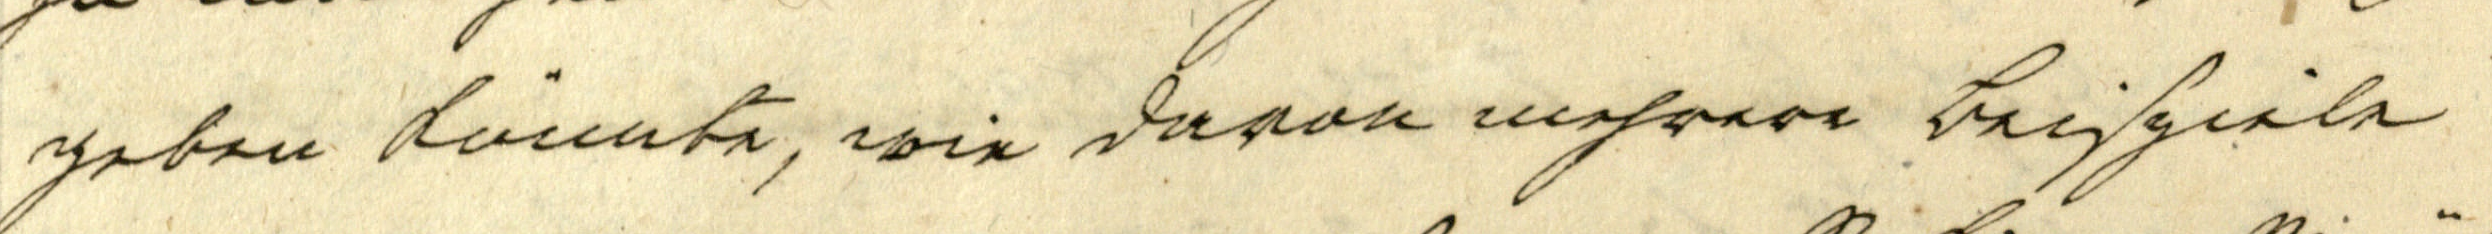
geben könnte, wie davon mehrere Beispiele
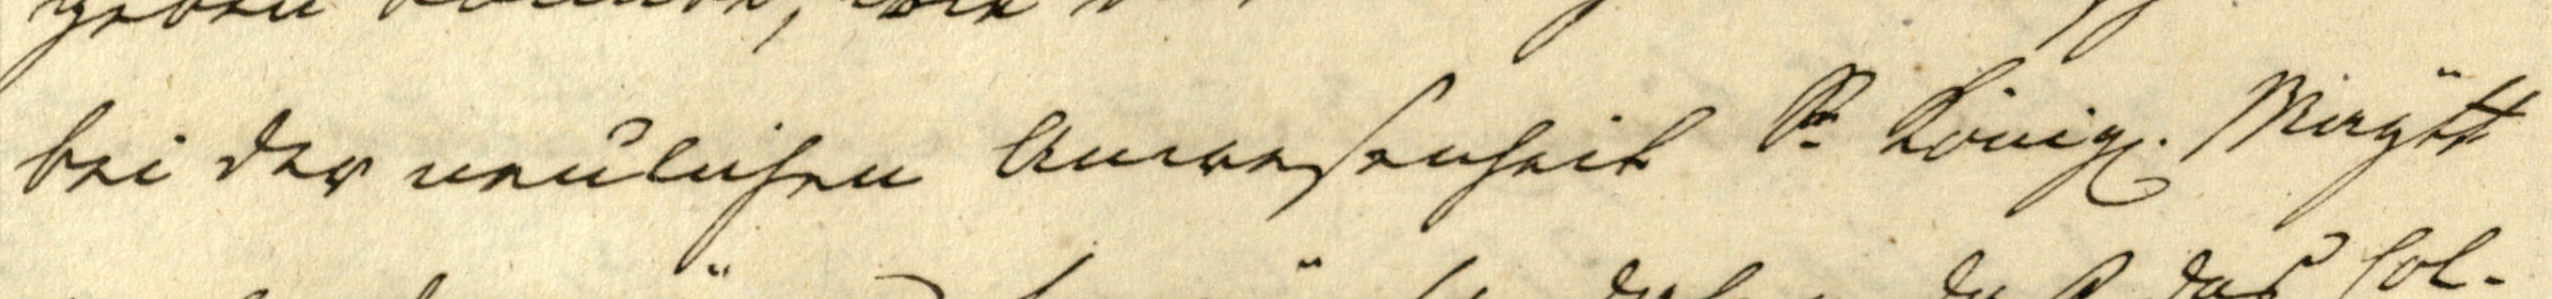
bei der neulichen Anwesenheit Sr Königl. Maÿtt
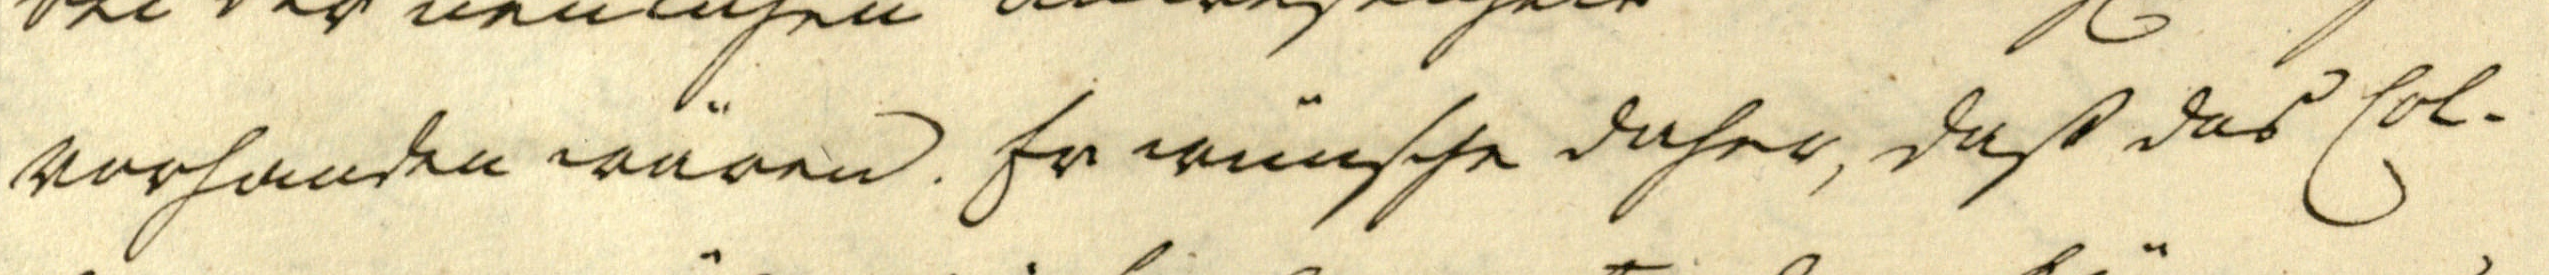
vorhanden wären. Er wünsche daher, daß das Col¬
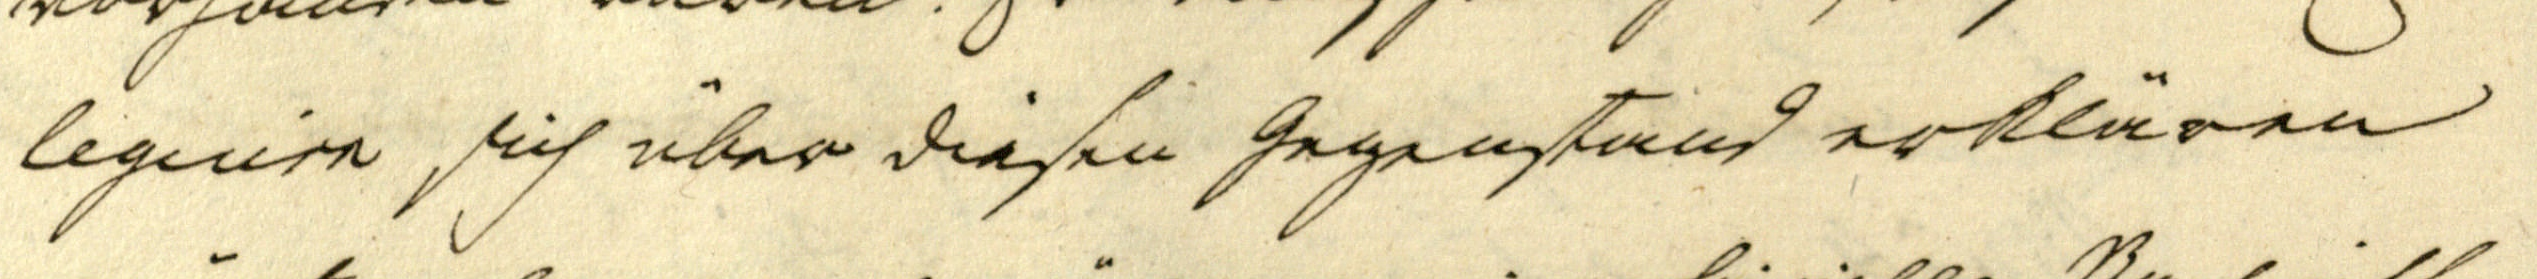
legium sich über diesen Gegenstand erklären
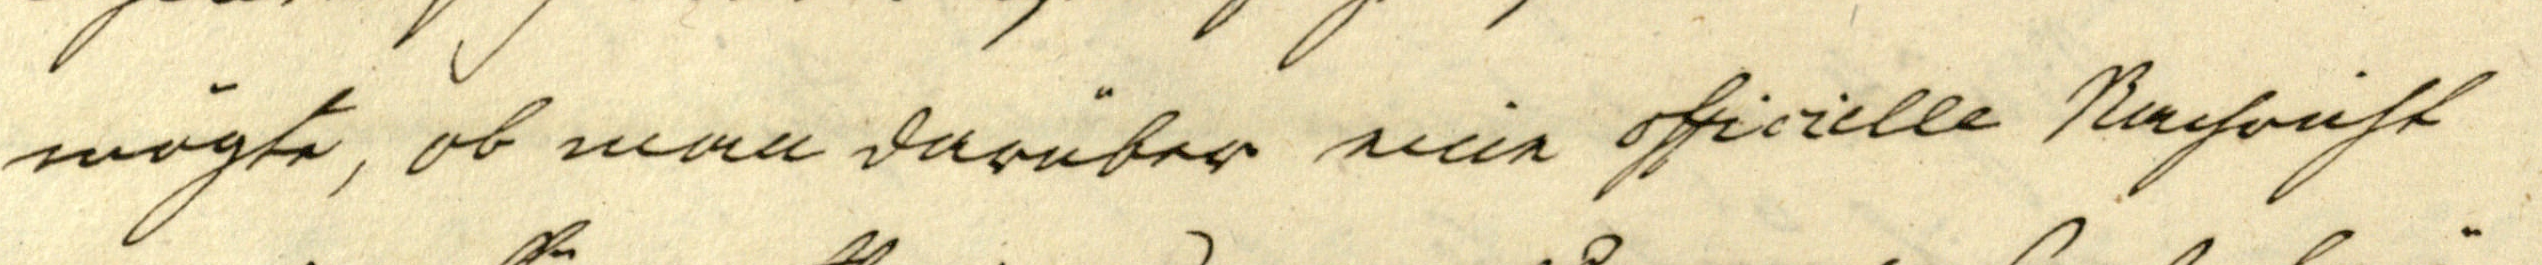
mögte, ob man darüber eine officielle Nachricht
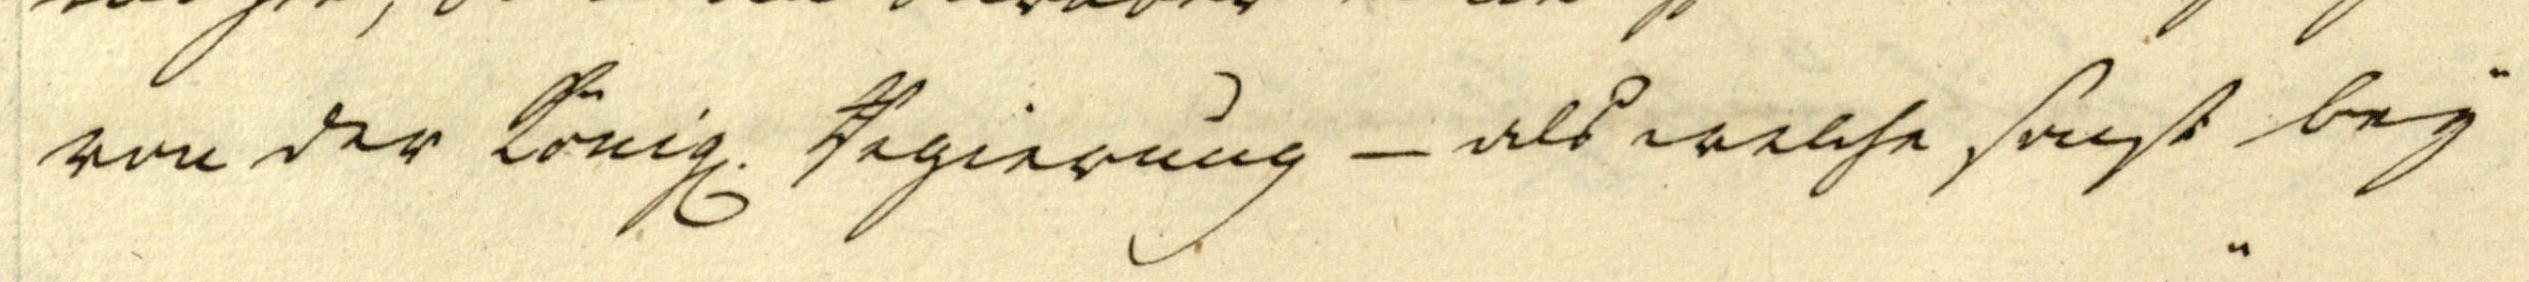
von der Königl. Regierung als welche sonst beÿ
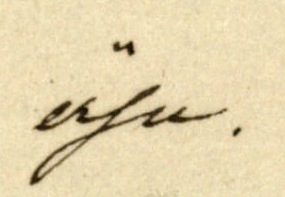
ähn.
